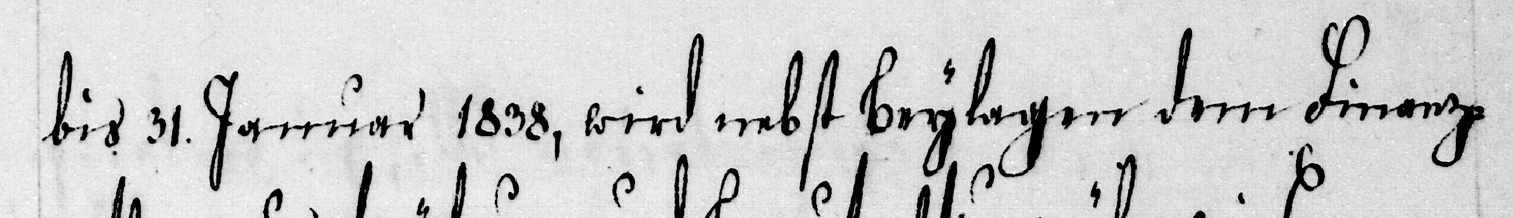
bis 31. Januar 1838., wird nebst Beylagen dem Finanz¬
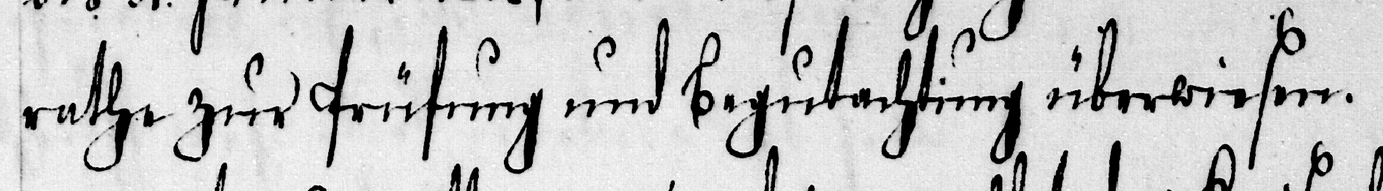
rathe zur Prüfung und Begutachtung überwiesen.
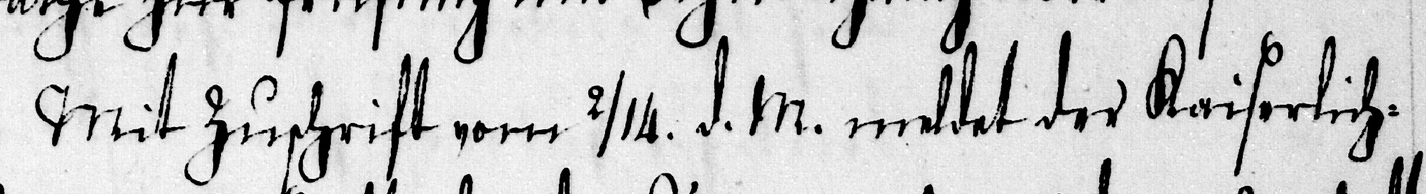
Mit Zuschrift vom 2/14. d. M. meldet der Kaiserlic¬
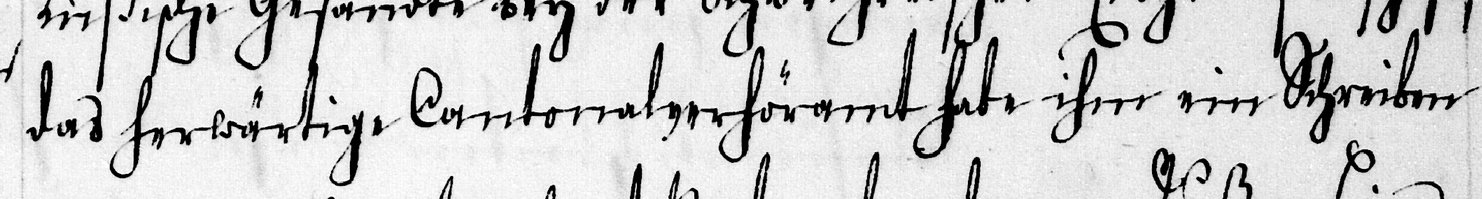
das herwärtige Cantonalverhöramt habe ihm ein Schreiben
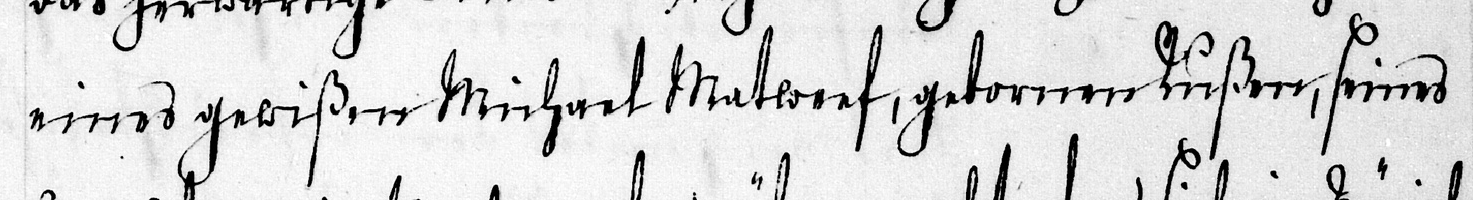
eines gewißen Michael Matweef, gebornen Rußen, seines
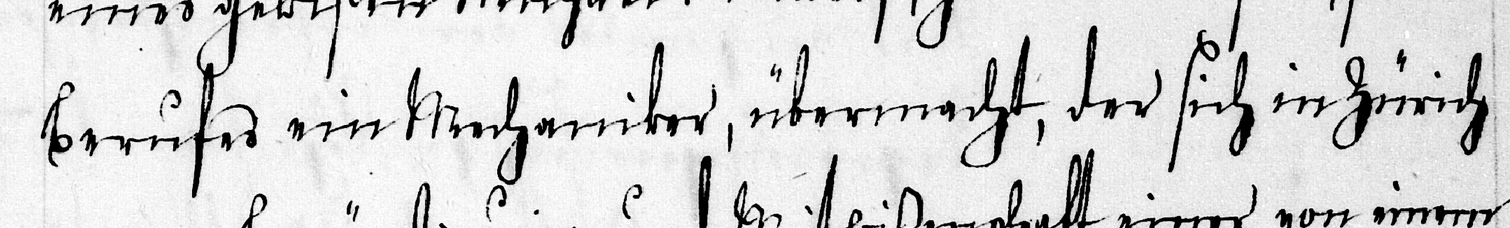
Berufes ein Mechaniker, übermacht, der sich in Zürich
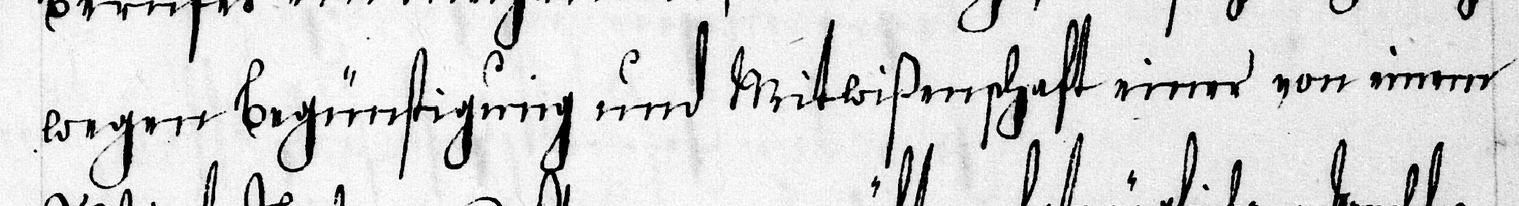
wegen Begünstigung und Mitwißenschaft einer von einem
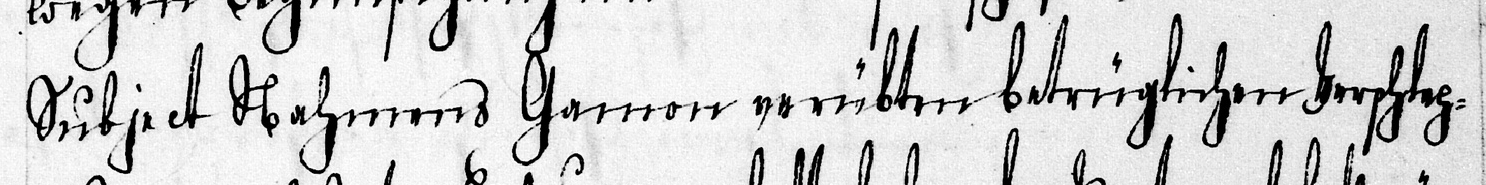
Subject Nahmens Gamon verübten betrüglichen Verschle¬
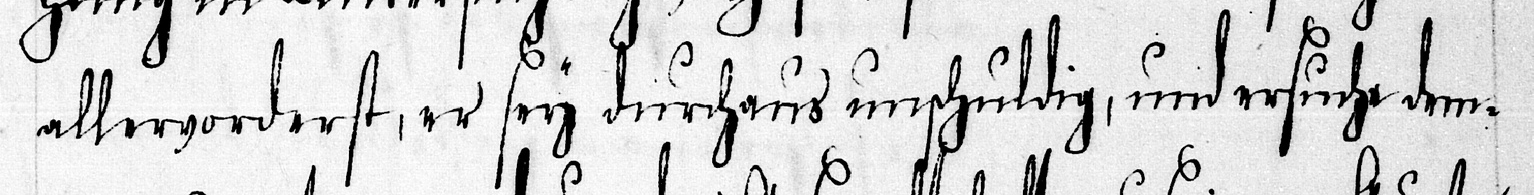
allervorderst, er sey durchaus unschuldig, und ersuche dem¬
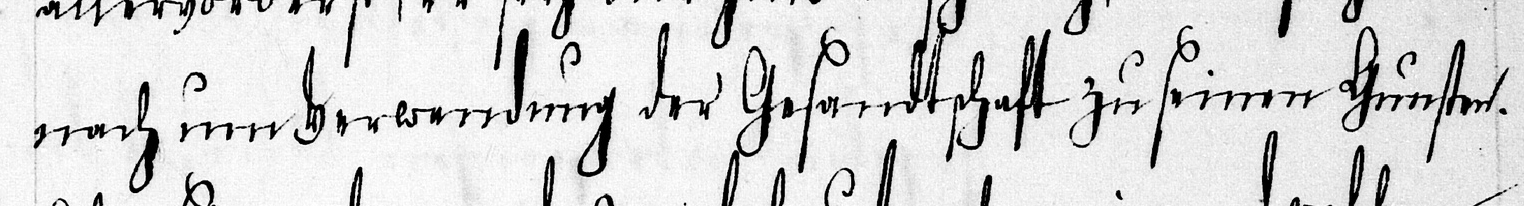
nach um Verwendung der Gesandtschaft zu seinen Gunsten.
